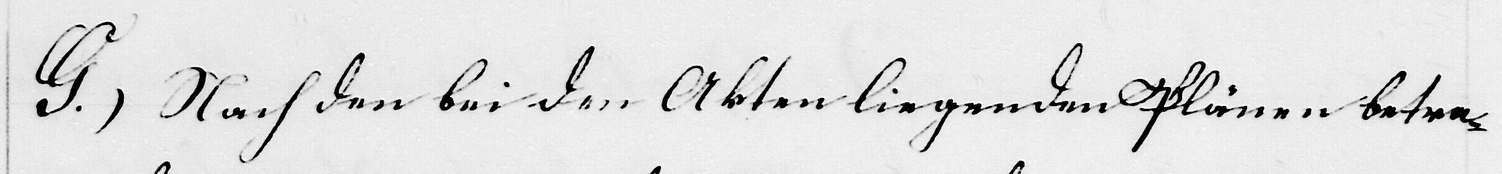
G.) Nach den bei den Akten liegenden Plänen betra¬
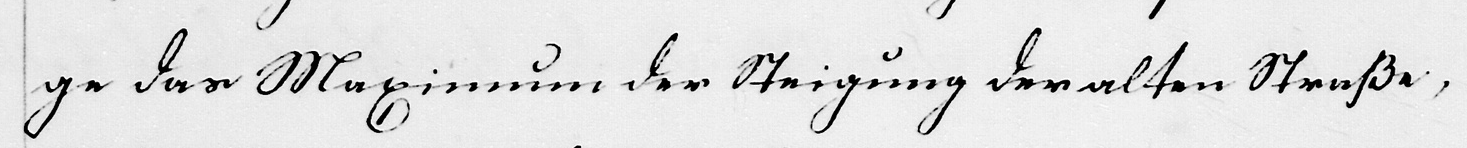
ge das Maximum der Steigung der alten Straße,
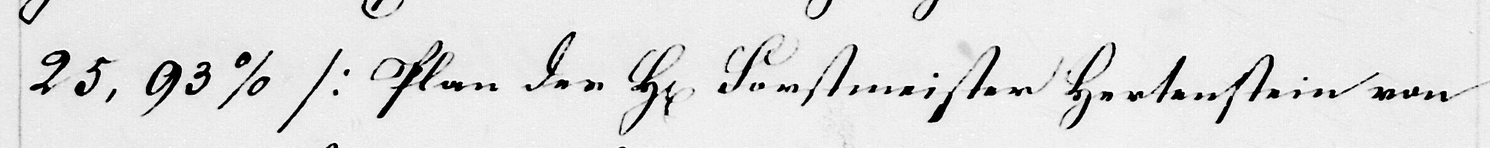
25,93 % [Plan des H[errn] Forstmeister Hertenstein von
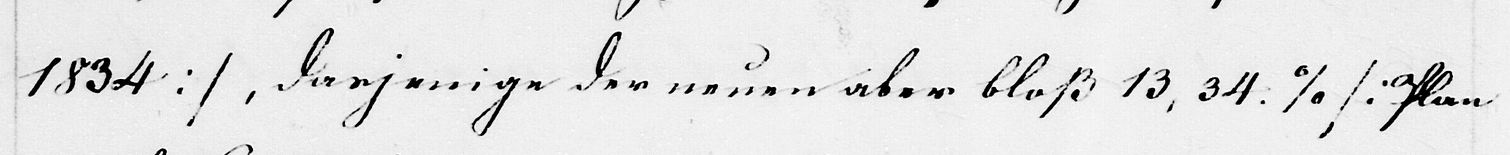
1834], dasjenige der neuen aber bloß 13,34 % [Plan
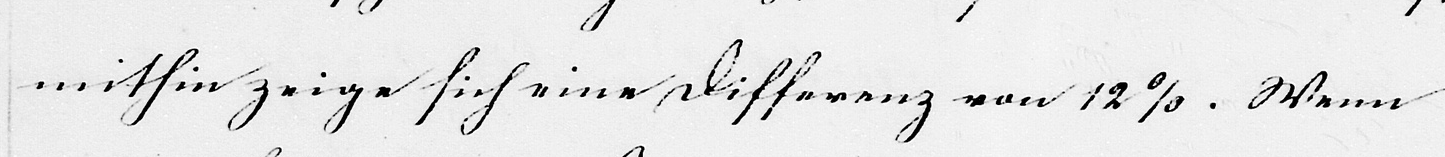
mithin zeige sich eine Differenz von 12 %. Wenn
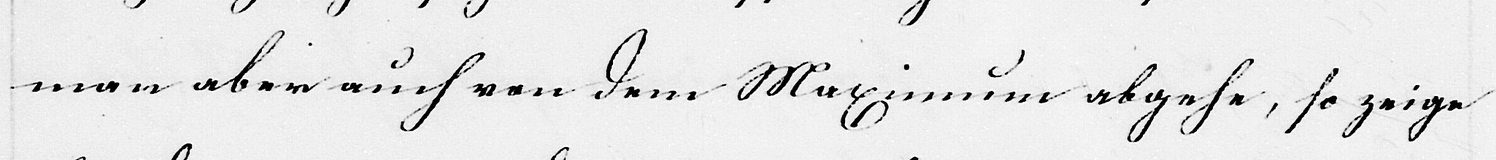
man aber auch von dem Maximum abgehe, so zeige
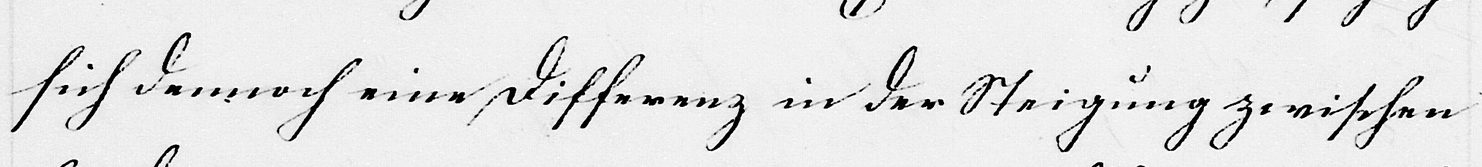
sich dennoch eine Differenz in der Steigung zwischen
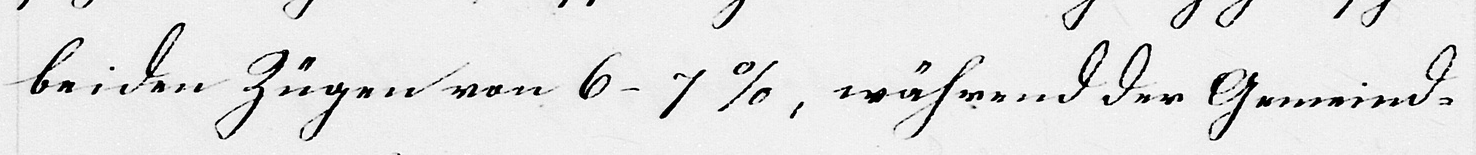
beiden Zügen von 6−7 %, während der Gemeind¬
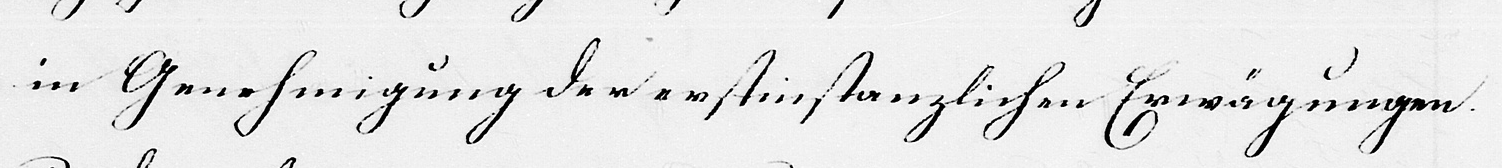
in Genehmigung der erstinstanzlichen Erwägungen
